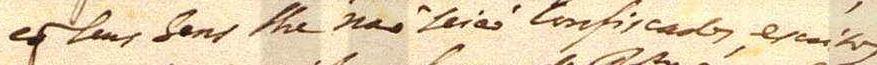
e q̄ seus bens lhe naõ seiaõ confiscados, escritos
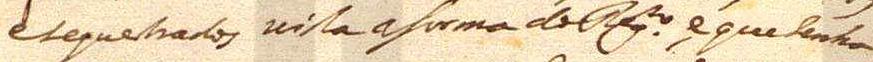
e sequestrados uista a forma do Reg.to, e que tenha
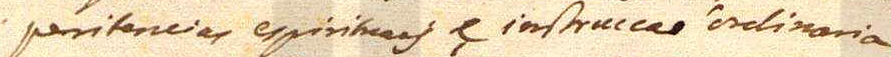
penitencias espirituais, e instruccaõ ordinaria
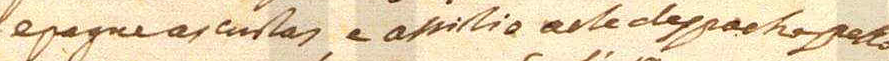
e pague as custas, e assistio a este despacho pello
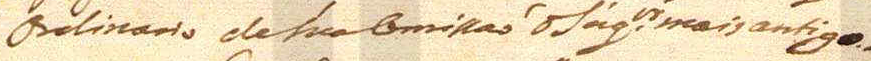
Ordinario de sua comissaõ o Inq.or mais antigo.
